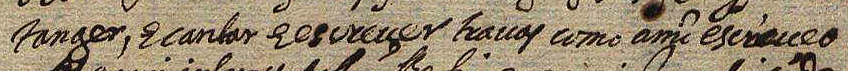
tanger, E cantar E escreuer trauas como a mī escreueo
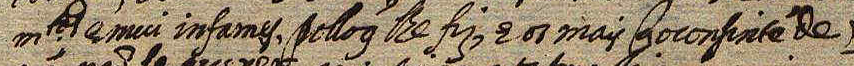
mta.s e mui infames, pello q̄ lhe fiz, E os mais q̄ o consintē de
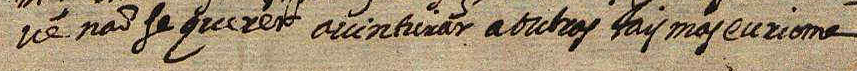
uē naõ se querer auinturar a outras tais mas eu riome
